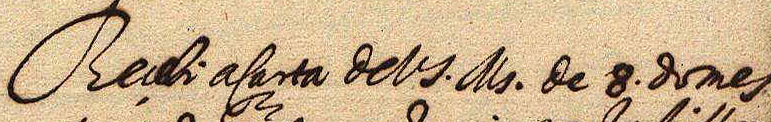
Recebi a Carta de VS. Ms. de 8. do mes
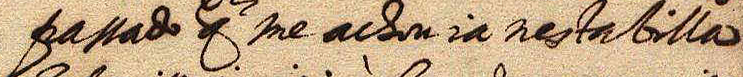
passado q̄ me achou ia nesta villa
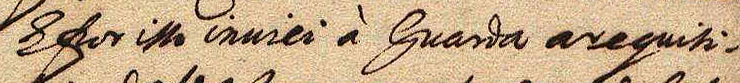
E por isso inuiei à Guarda a requisi
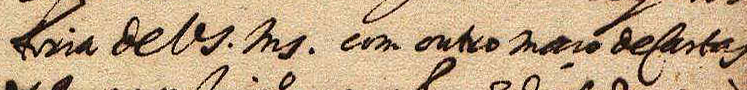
toria de Vs. ms. com outro maço de Cartas
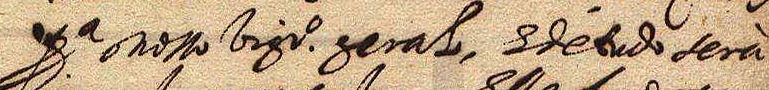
ꝑa o nosso Vigr.o geral, E de tudo serà
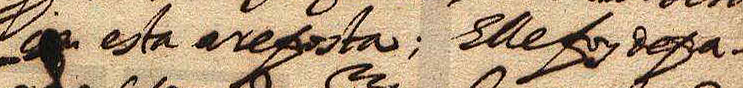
_ esta a reposta; Elle foy de pa
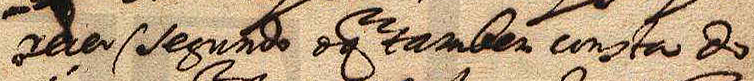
recer (segundo o q̄ tambem consta do
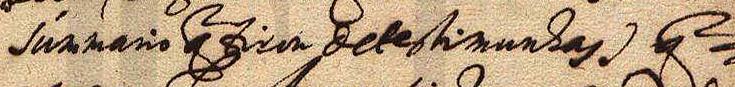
summario q̄ tirou de testimunhas) q̄
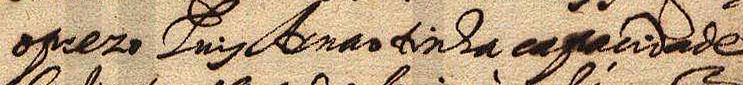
o prezo Luis Arnao tinha capacidade
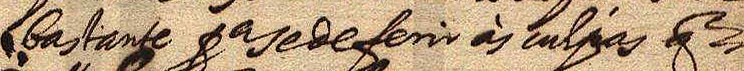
bastante ꝑa se deferir às culpas q̄
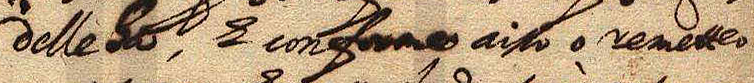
delle ha, E conforme a isso o remetteo
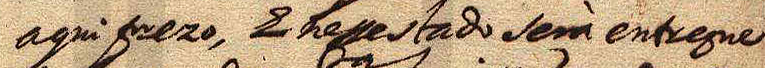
aqui prezo, E nesse stado serà entregue
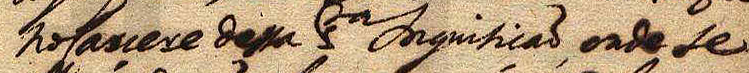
no Carcere dessa sta Inquisiçaõ, onde se
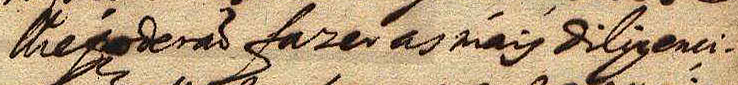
lhe poderaõ fazer as mais diligenci
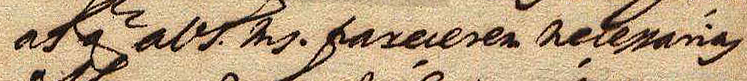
as q̄ a Vs. ms. parecerem necessarias
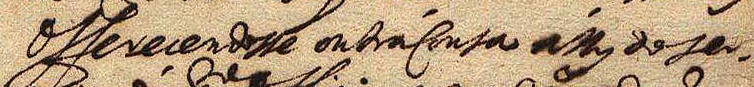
offerecendosse outra Cousa assy do ser
